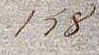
158
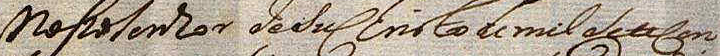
nosso senhor Iesu Christo de mil seteCen
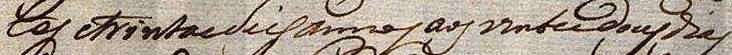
tos e trinta e seis annos aos vinte dous dias
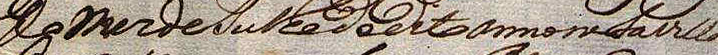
do mez de Iulho do dito anno nesta villa
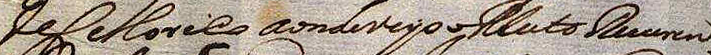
de Cellorico aonde veyo o Muto Reueren
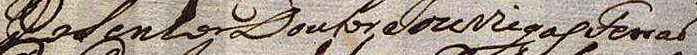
do Senhor Doutor Ioze viegas Ferraõ
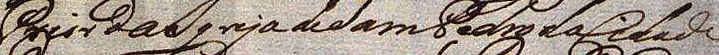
Prior da Igreja de Sam Pedro da Cidade
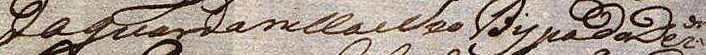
da guarda nelle e Seo Bispado Dez.or
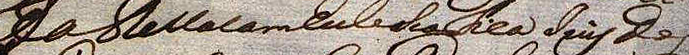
da Rellaçam Ecclesiastica Iuis dos
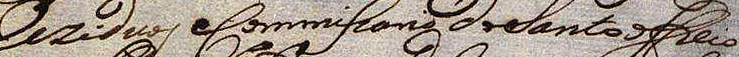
Reziduos e Commissario do Santo officio
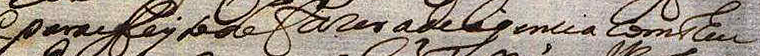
e para effeyto de fazer a deligencia comtheu
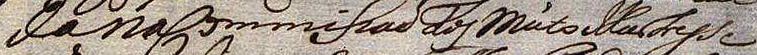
da na Commissaõ dos Muto Illustres se
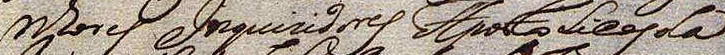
nhores Jnquizidores Apostolicos da
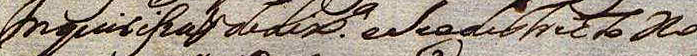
Inquizissaõ de Lix.a e seu districto no
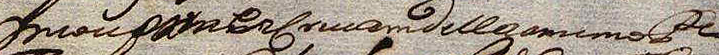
meou para EzCreuam della a mim o Pe
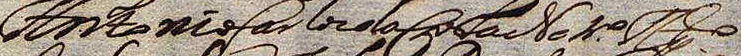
Antonio Carloz da Costa Notr.o Ap.co
